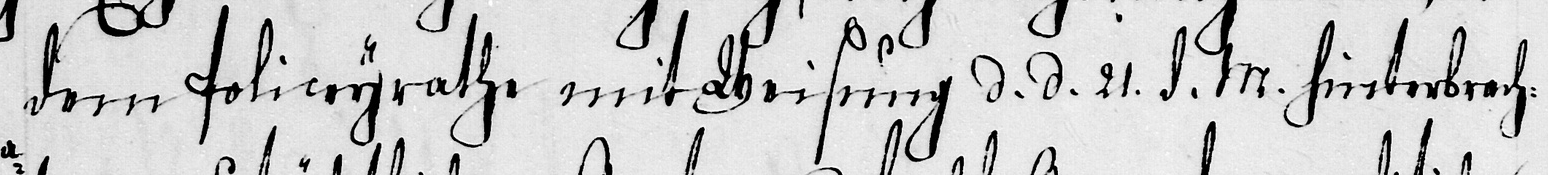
dem Policeyrathe mit Weisung d. d. 21. d. M. hinterbrac¬
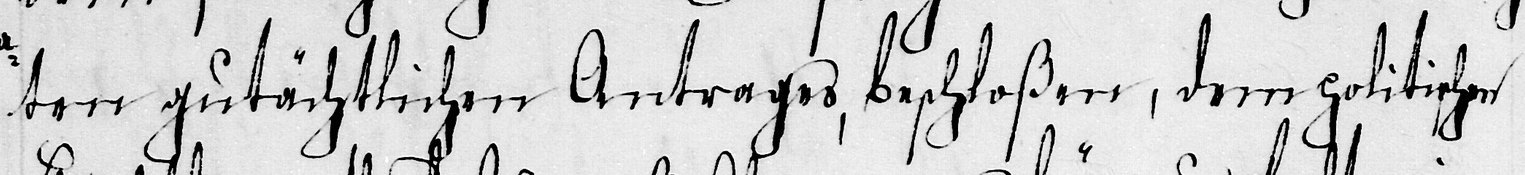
hten gutächtlichen Antrages, beschloßen, dem politischen
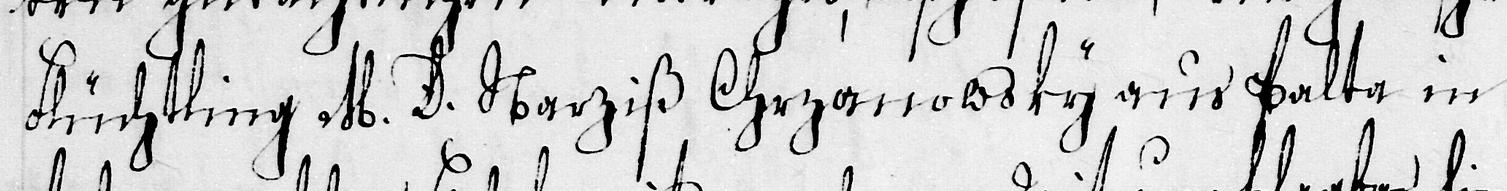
Flüchtling M. D. Narziß Chrzanowsky aus Balta in
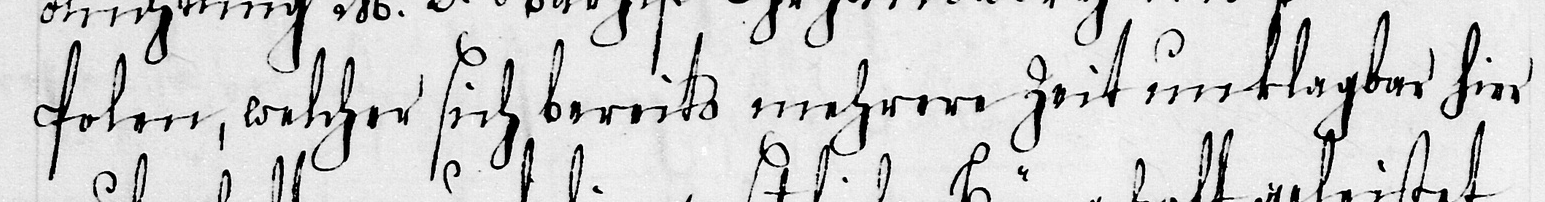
Polen, welcher sich bereits mehrere Zeit unklagbar hier
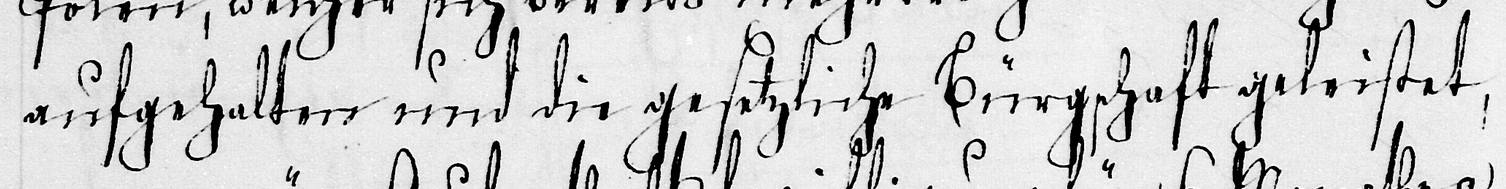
aufgehalten und die gesetzliche Bürgschaft geleistet,
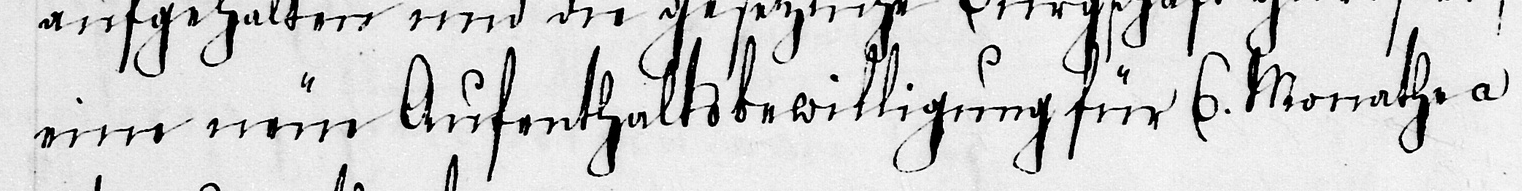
eine neue Aufenthaltsbewilligung für 6. Monathe a
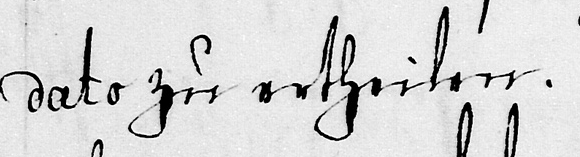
dato zu ertheilen.
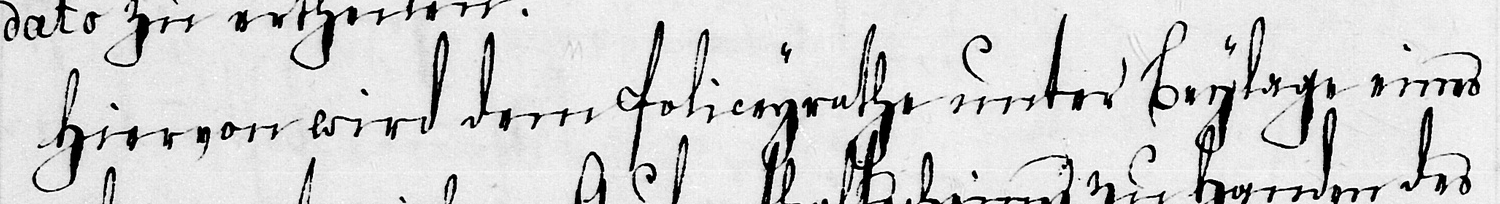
Hiervon wird dem Policeyrathe unter Beylage eines
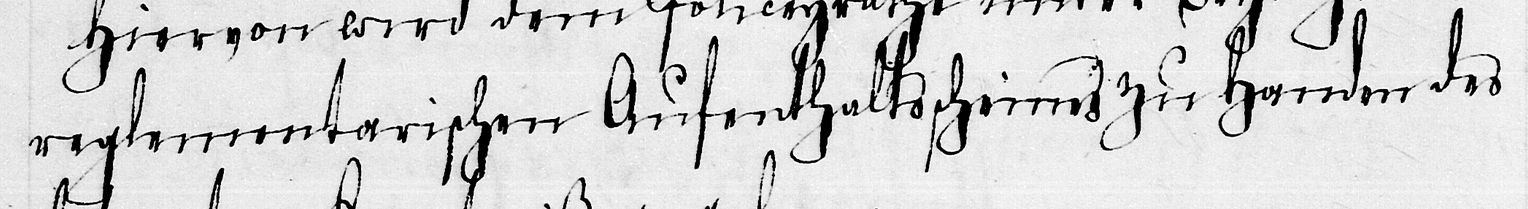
reglementarischen Aufenthaltsscheines zu Handen des
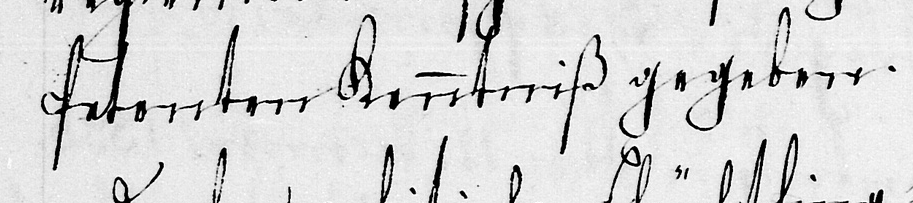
Petenten Kenntniß gegeben.
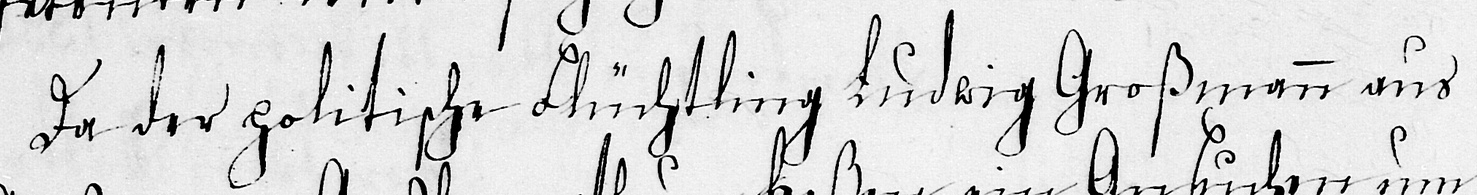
Da der politische Flüchtling Ludwig Großmann aus
